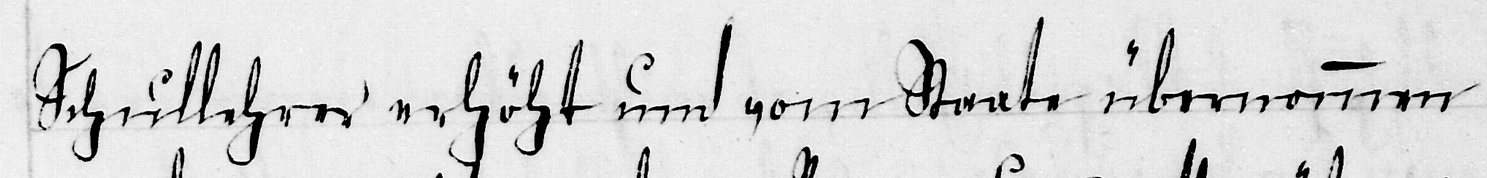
Schullehrer erhöht und vom Staate übernommen
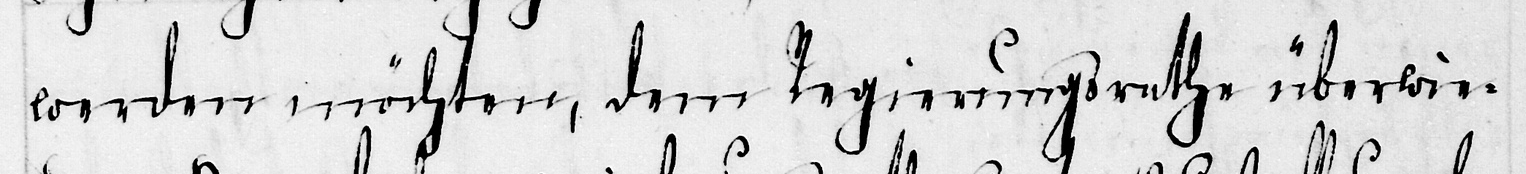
werden möchten, dem Regierungsrathe überwie¬
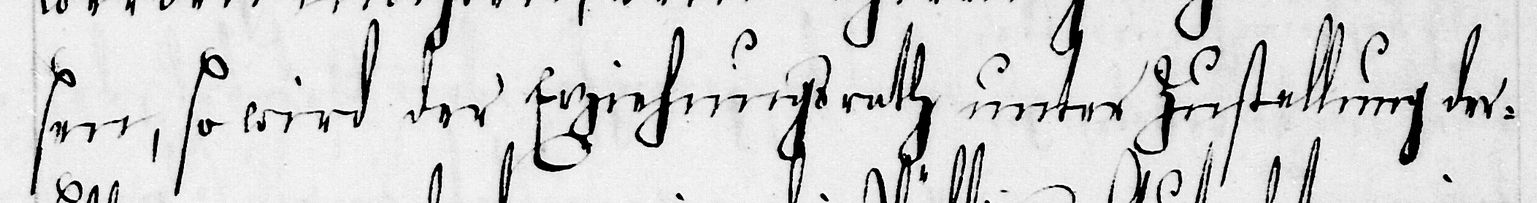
sen, so wird der Erziehungsrath unter Zustellung de¬
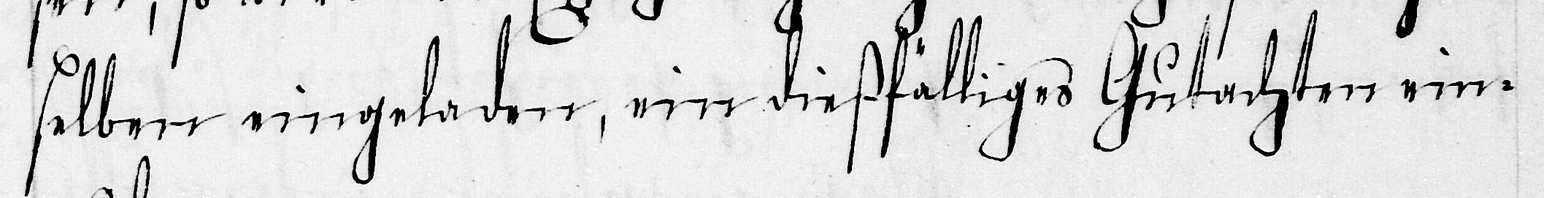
selben eingeladen, ein dießfälliges Gutachten ein¬
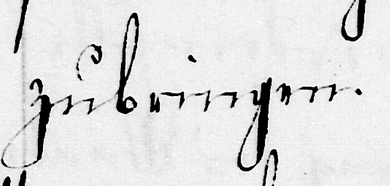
zubringen.
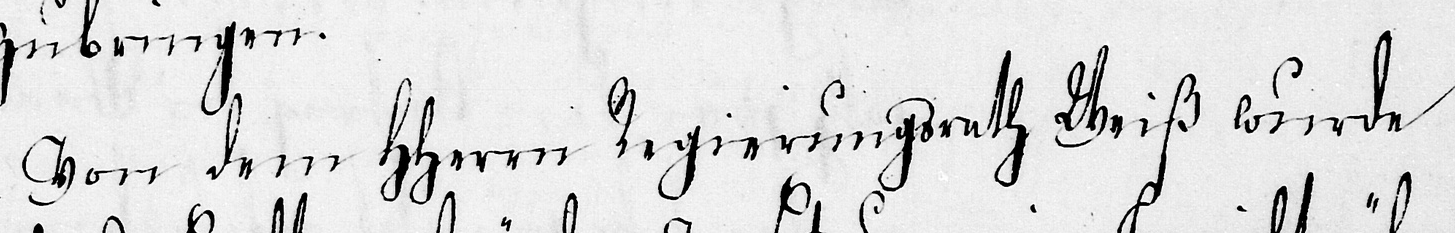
Von dem HHerrn Regierungsrath Weiß wurde
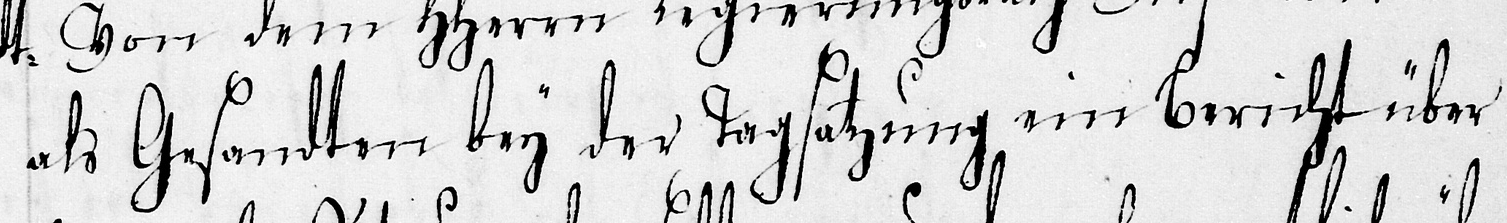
als Gesandten bey der Tagsatzung ein Bericht über
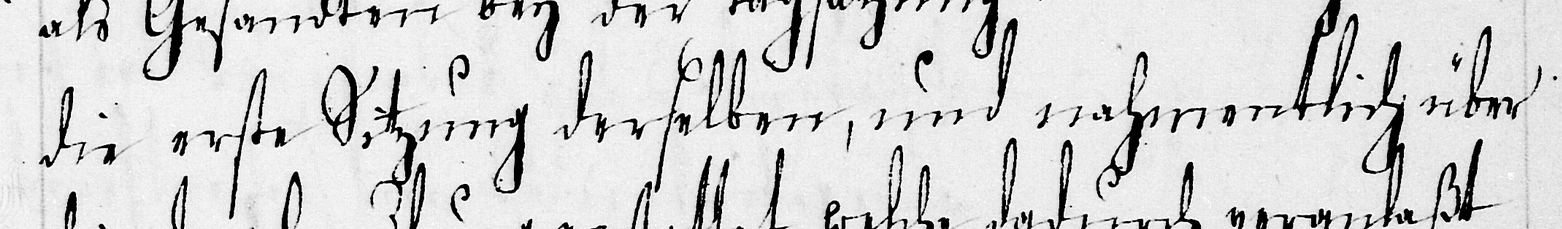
die erste Sitzung derselben, und nahmentlich über
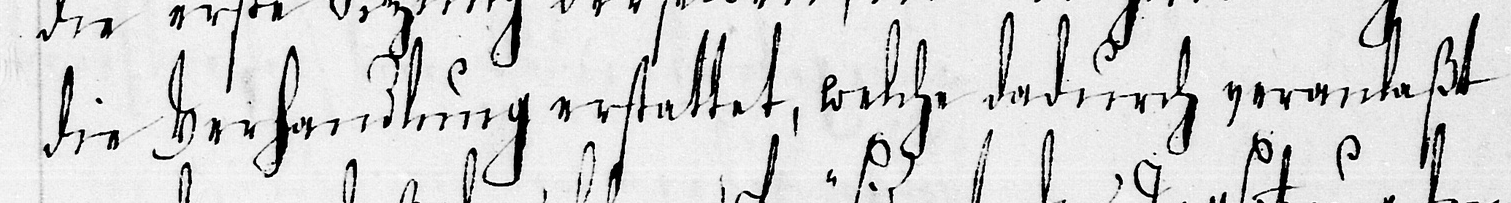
die Verhandlung erstattet, welche dadurch veranlaßt
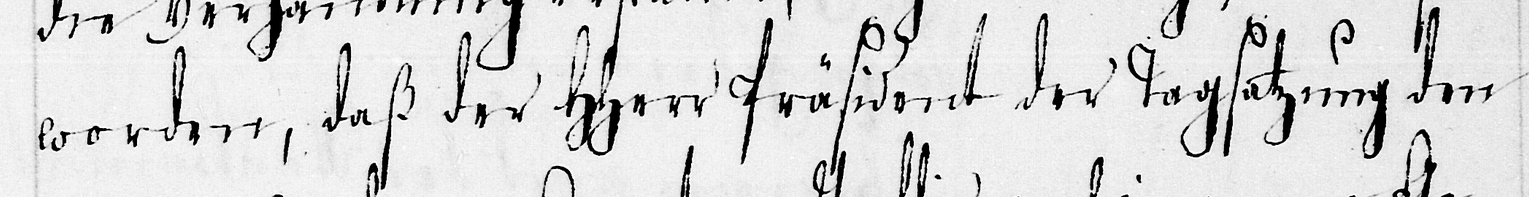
worden, daß der HHerr Präsident der Tagsatzung den
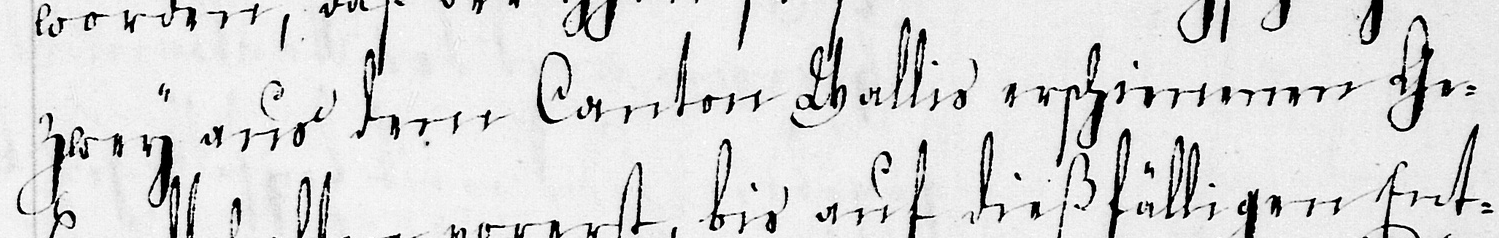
zwey aus dem Canton Wallis erschienenen Ge¬
